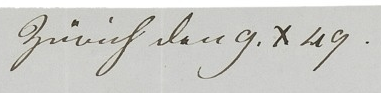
Zürich den 9. X 49.
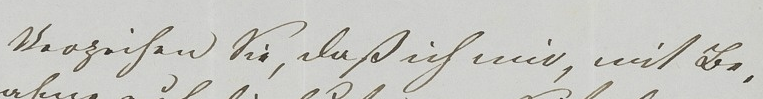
Verzeihen Sie, daß ich mir, mit Be-
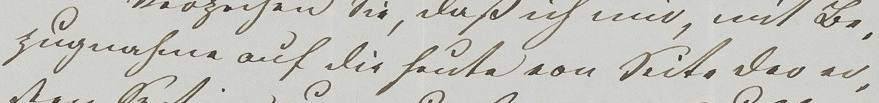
zugnahme auf die heute von Seite der er-
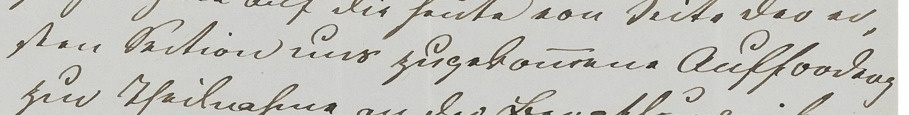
sten Section uns zugekommene Aufforderg
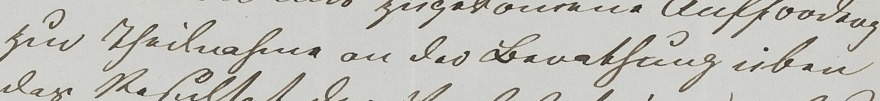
zur Theilnahme an der Berathung über
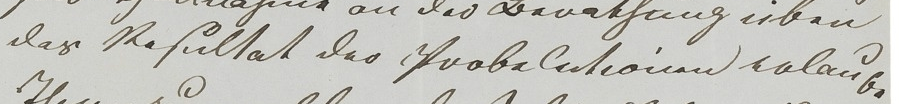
das Resultat der Probelectionen erlaube,
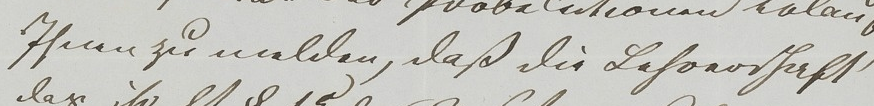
Ihnen zu melden, daß die Lehrerschaft
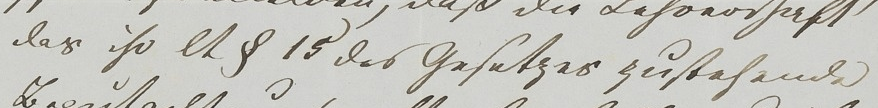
das ihr lt §15 des Gesetzes zustehende
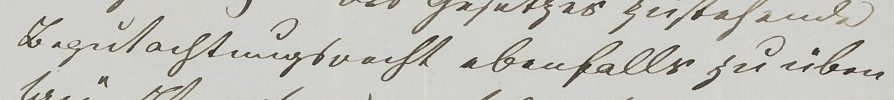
Begutachtungsrecht ebenfalls zu üben
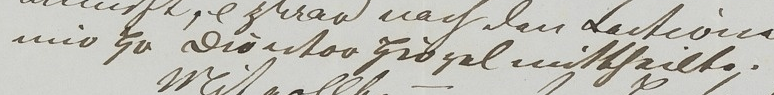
mir Hr Director Hirzel mittheilte.
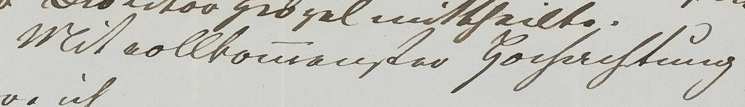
Mit vollkommenster Hochachtung
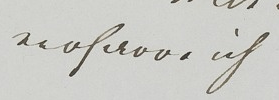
verharre ich
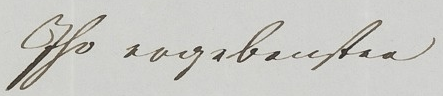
Ihr ergebenster
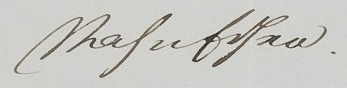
Rahn Escher.
